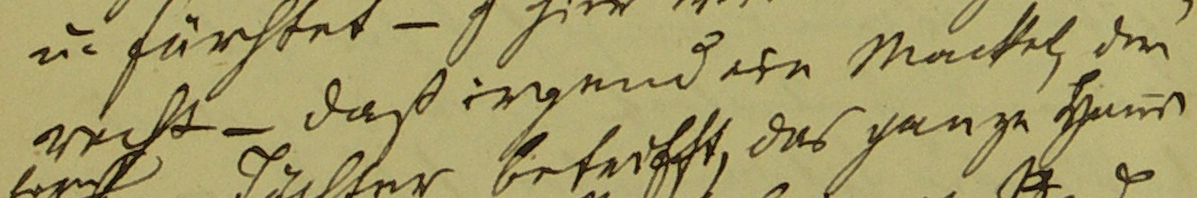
recht –das irgendein Makel die
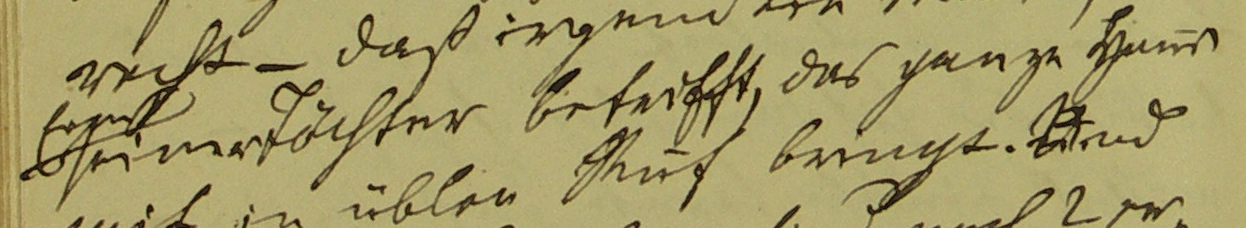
Ehre seiner Töchter betrifft , das ganze Haus
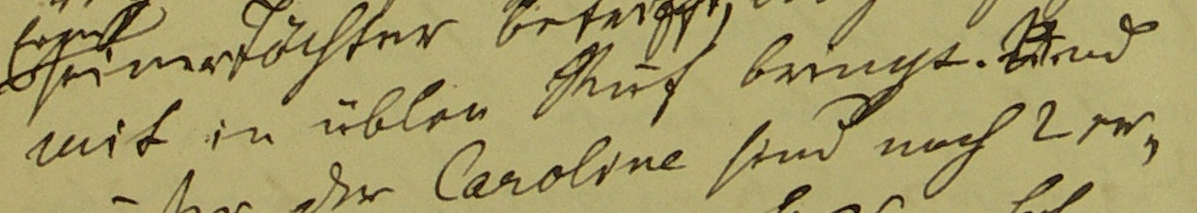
mit in übler Ruf bringt.- Und
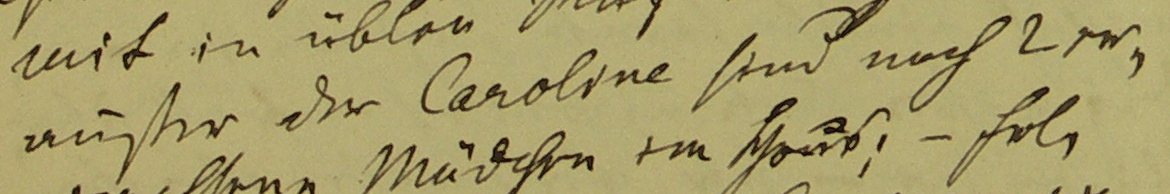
außer der Caroline sind noch 2 er¬
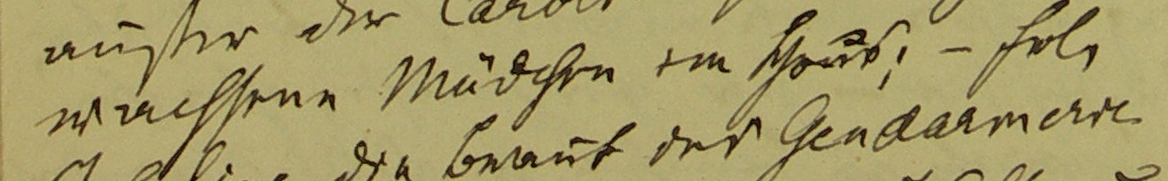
wachsene Mädchen im Haus;- Frl..
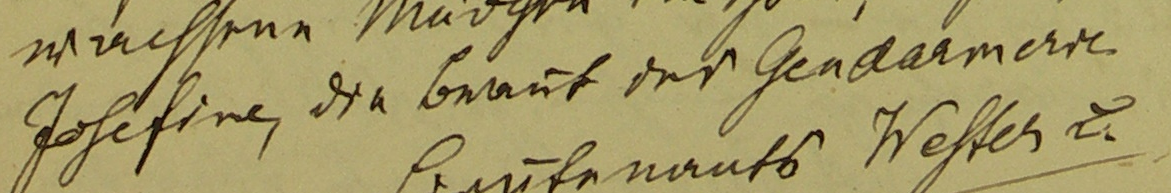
Josefine die Braut des Gendarmarie
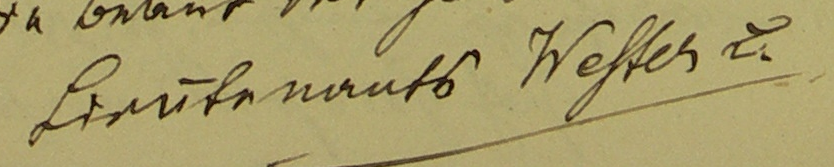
Lieutenents Westers und
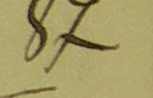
87
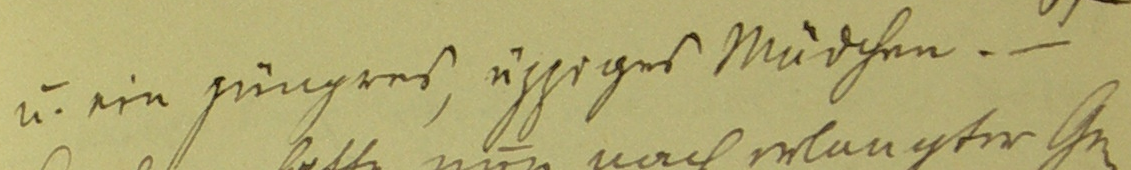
und ein jüngeres, üppiges Mädchen.
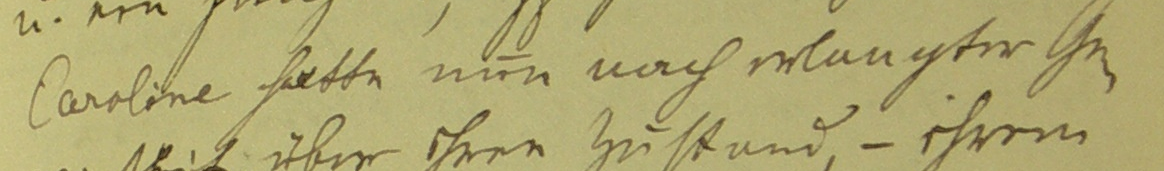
Caroline hatte nun nach erlangter Ge¬
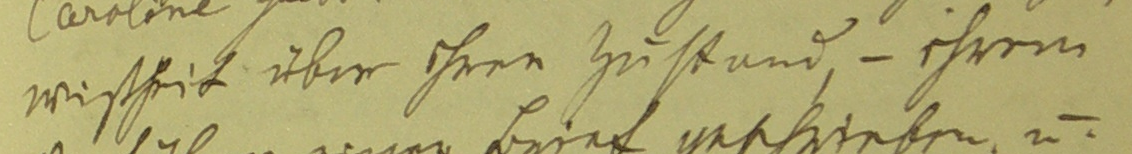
wißheit über ihren Zustand, -ihrem
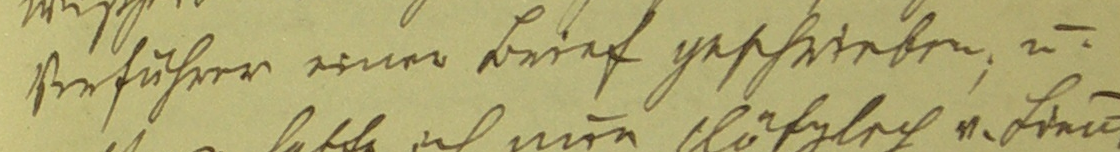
Verführer einen Brief geschrieben;- und
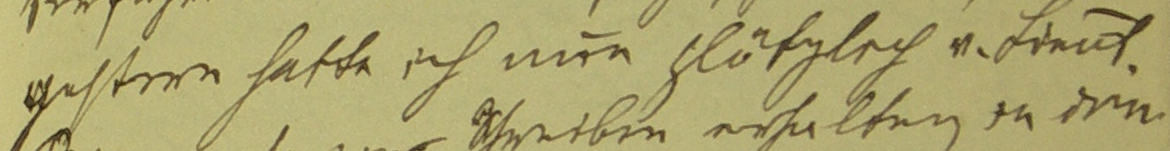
gestern hatte ich nun plötzlich von Lieutenant
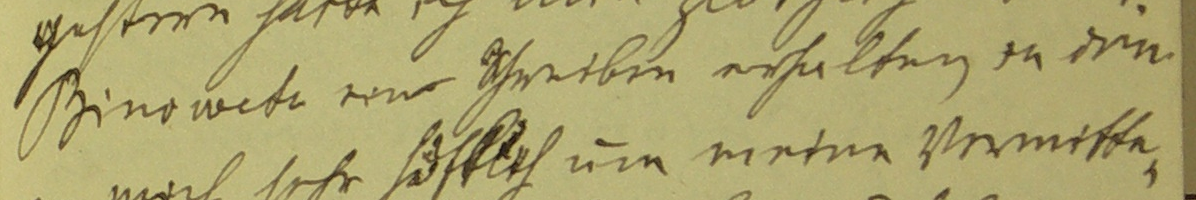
Binowek ein Schreiben erhalten in dem
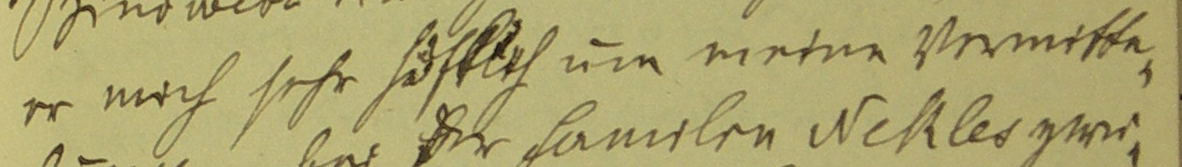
er mich sehr höflich um eine Vermitt¬
